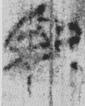○（寇）
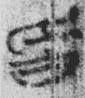昏（婚）
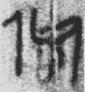佝（媾）
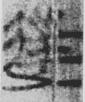○（往）
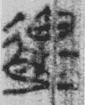遇
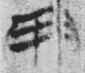雨
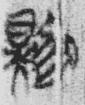則
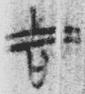吉
